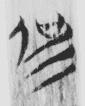侃
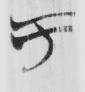于
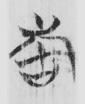𬚋
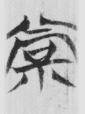常
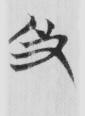及
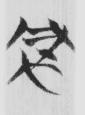風
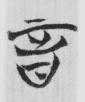音
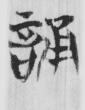誦
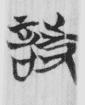詩
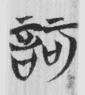訶
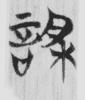{言肉木}
